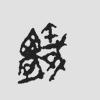鹹
